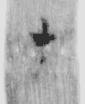十
